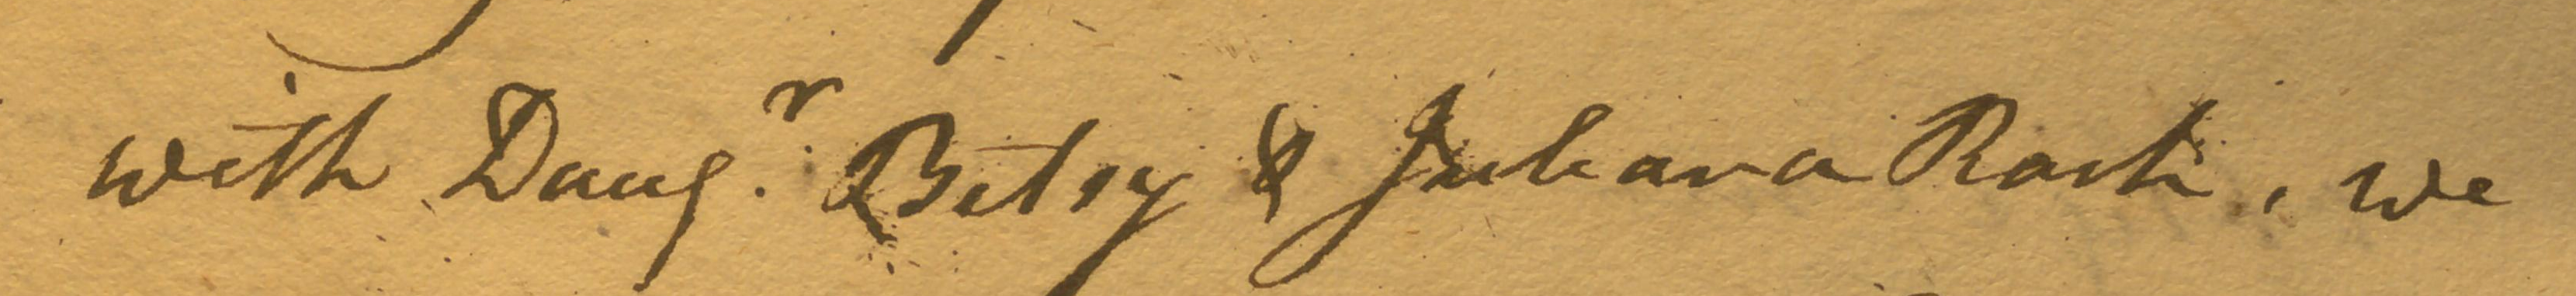with Daug^r. Betsy & Juliana Rash, we
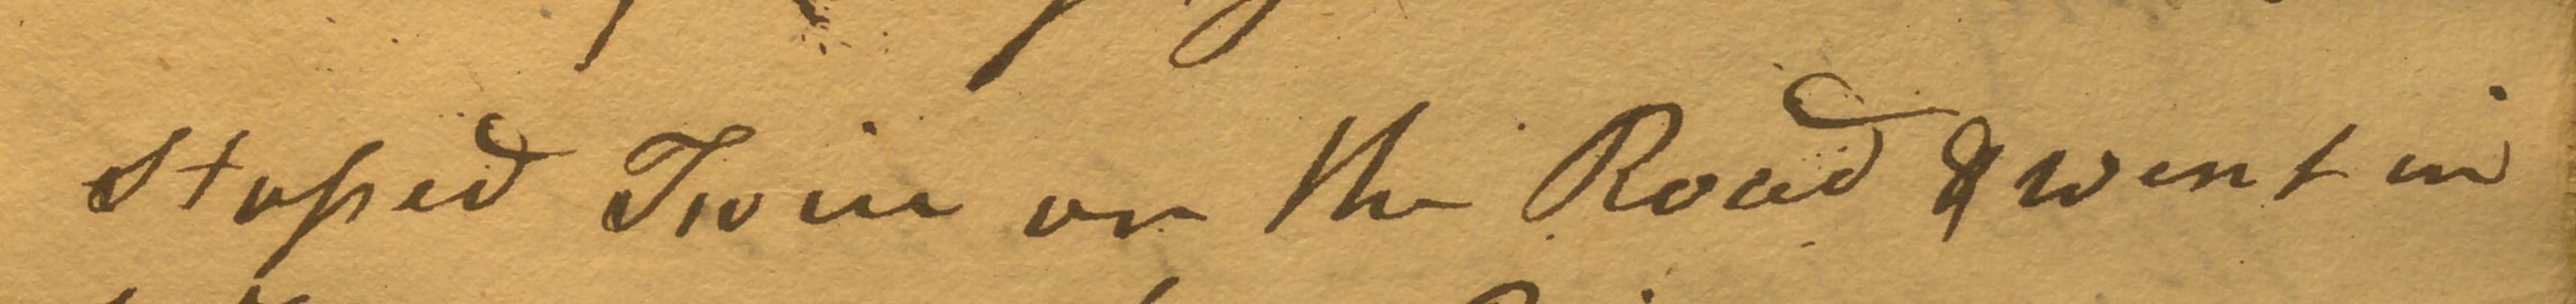stoped Twice on the Road & went in
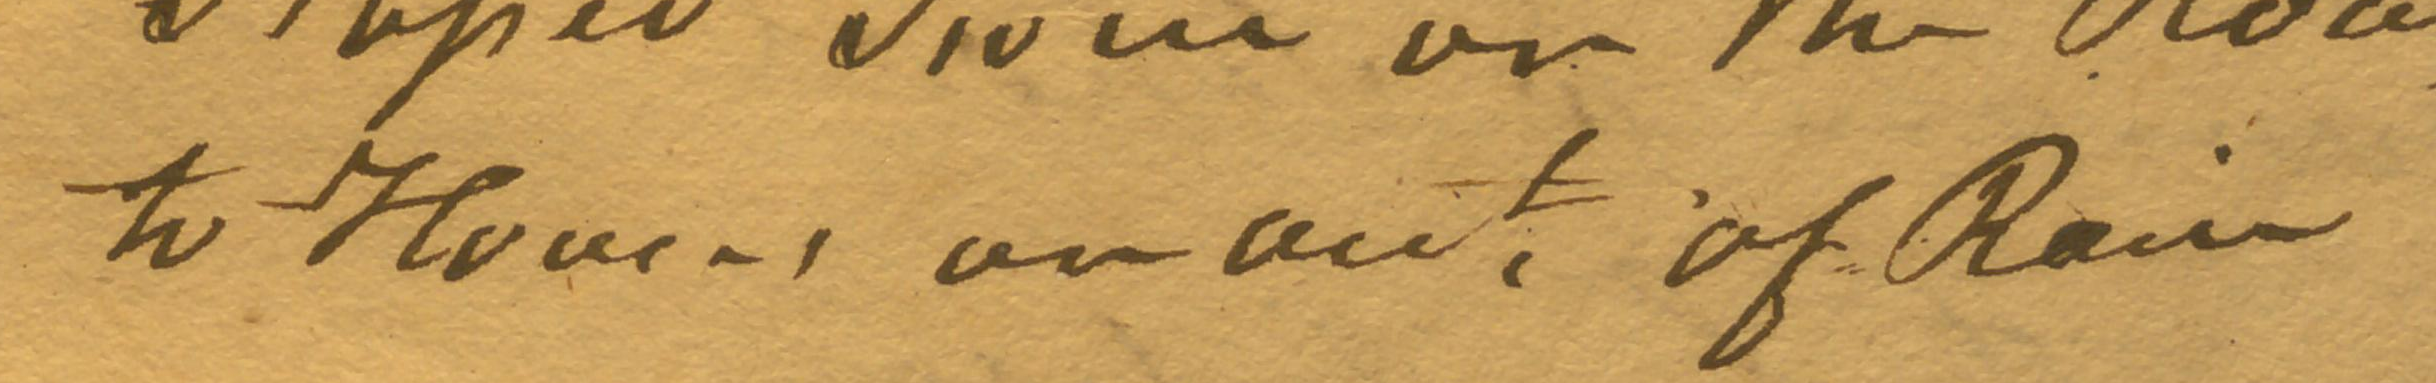to House, on acc^t. of Rain
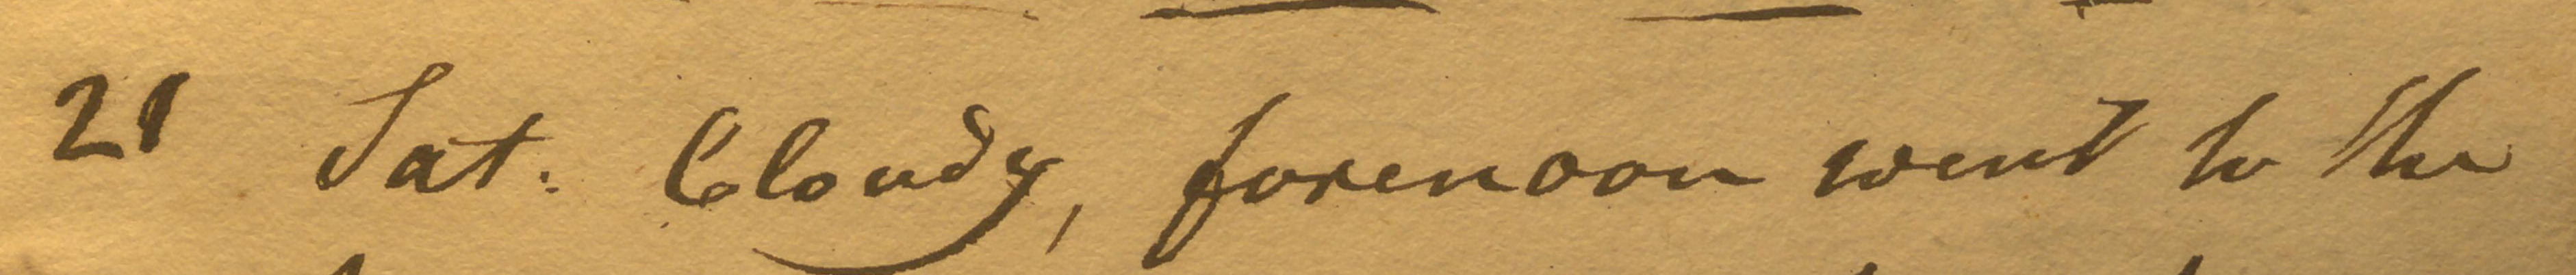21 Sat. Cloudy, forenoon went to the
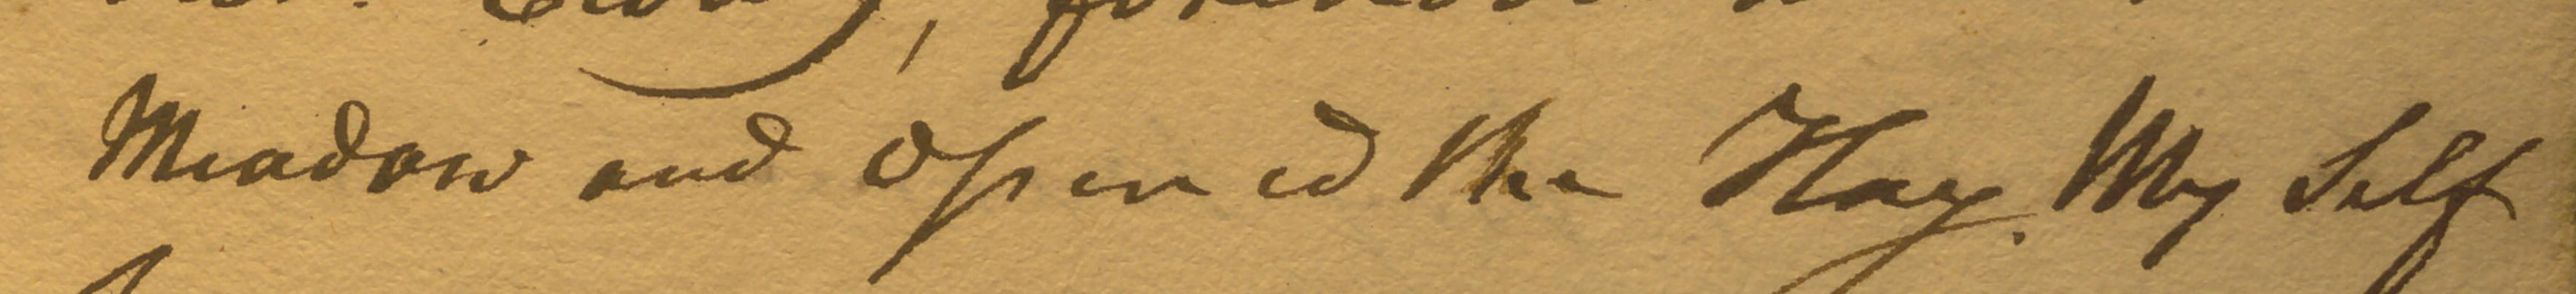Meadow and opened the Hay. My self
